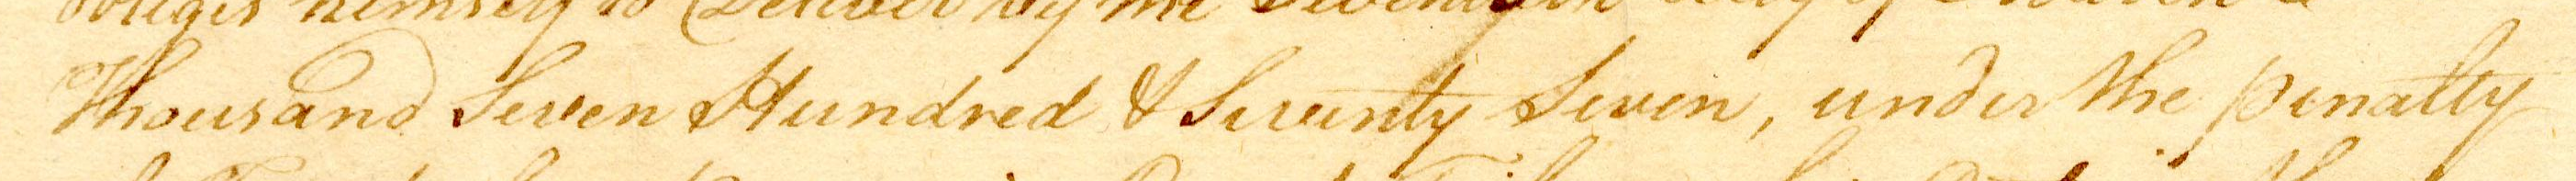Thousand Seven Hundred & Seventy Seven, under the penalty
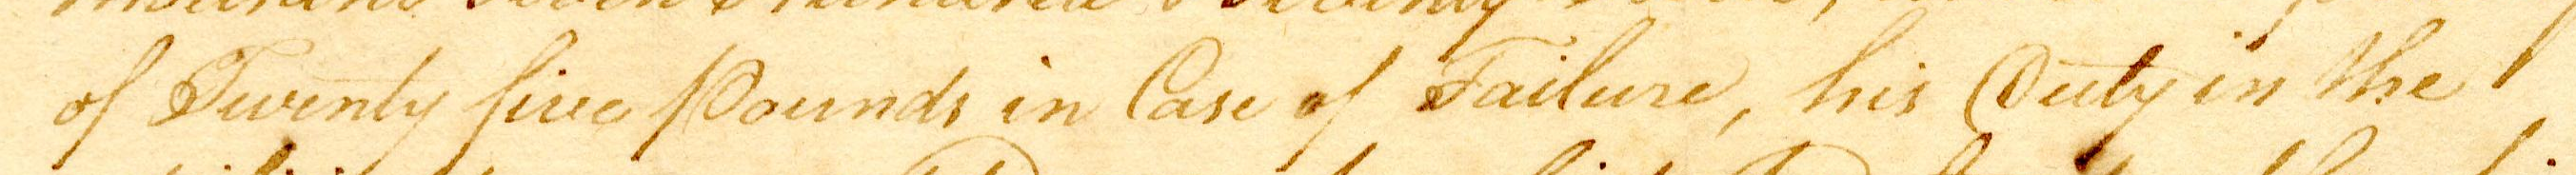of Seventy five pounds in Case of Failure, his duty in the
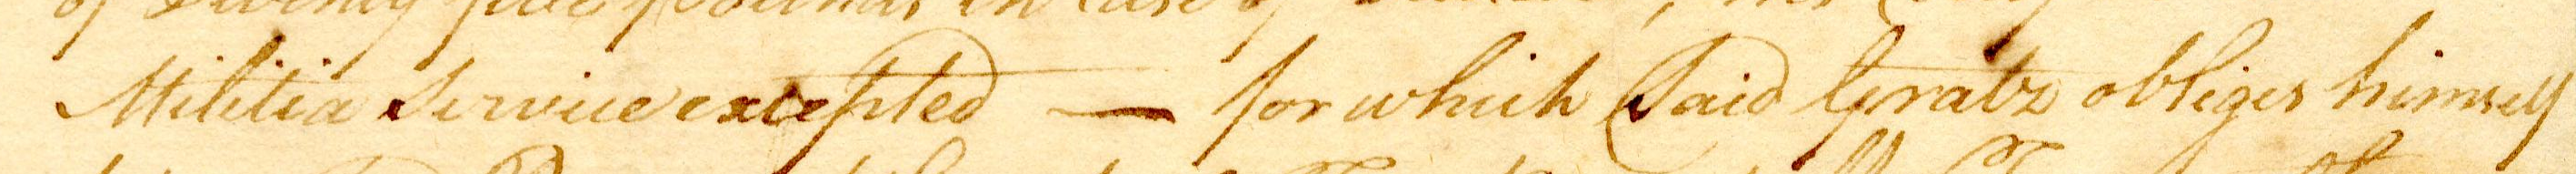Militia Service excepted- for which Said Gratz obliges himself
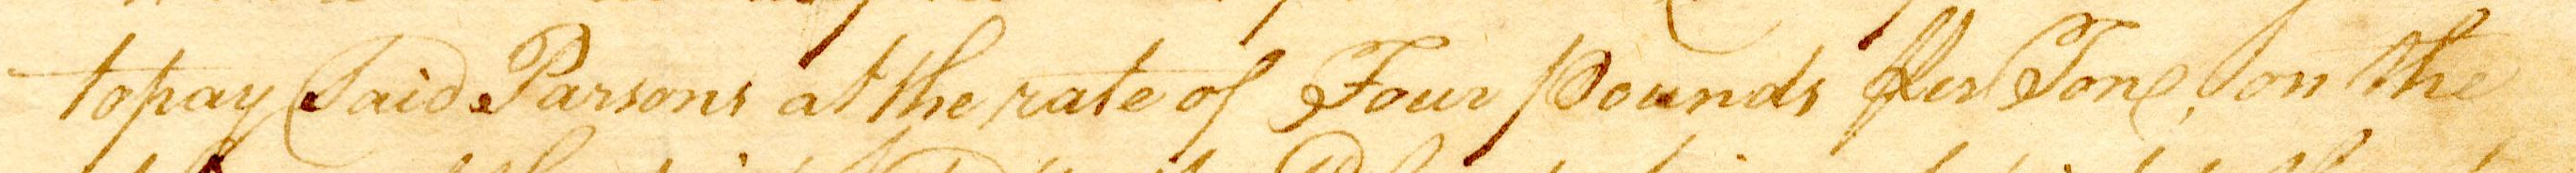to pay Said Parsons at the rate of Four pounds Per Tone, on the
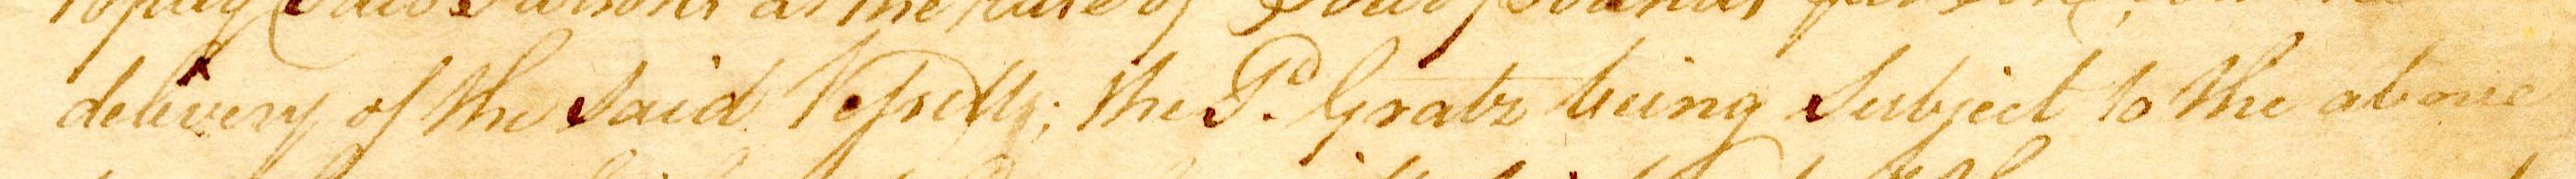delivery of the said Vessel; the s^d. Gratz being Subject to the above
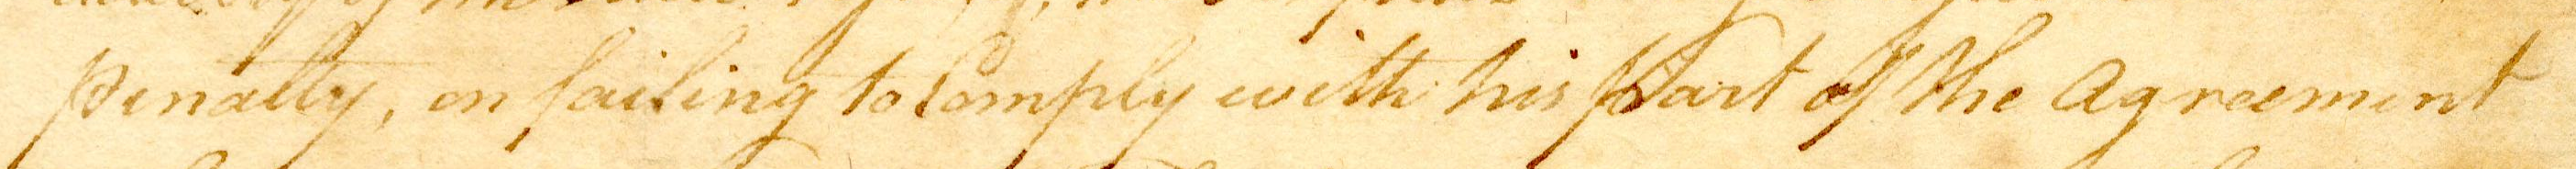penalty, on failing to Comply with his part of the Agreement
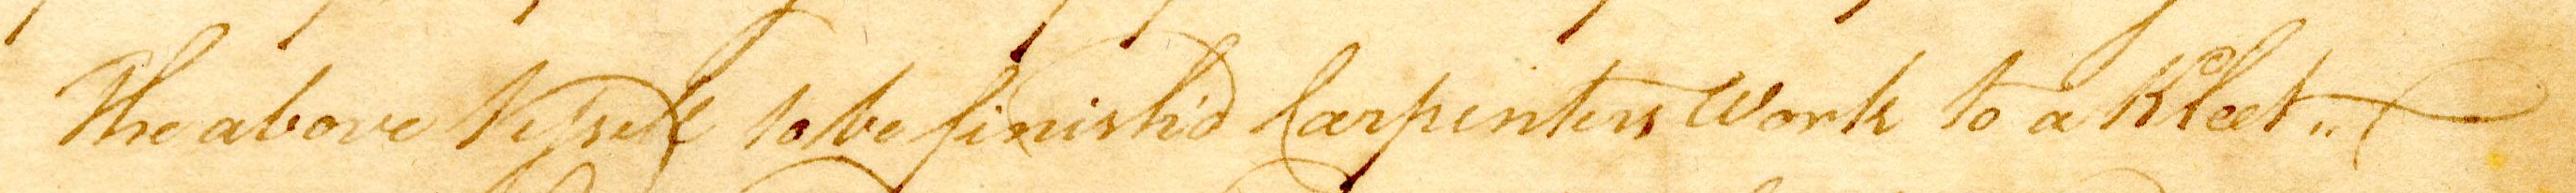The above is set to be finish'd Carpenters Work to a Kleet
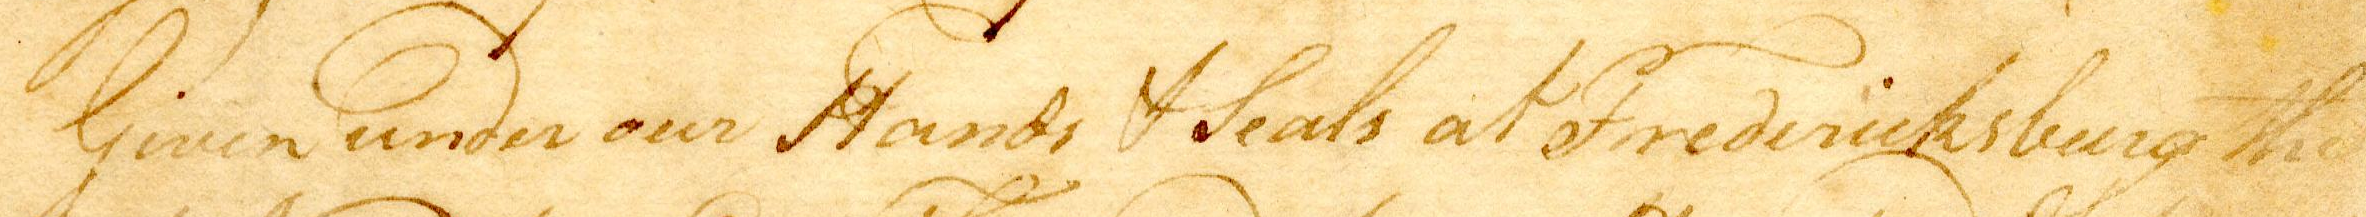Given under our Hands & Seals at Fredericksburg the
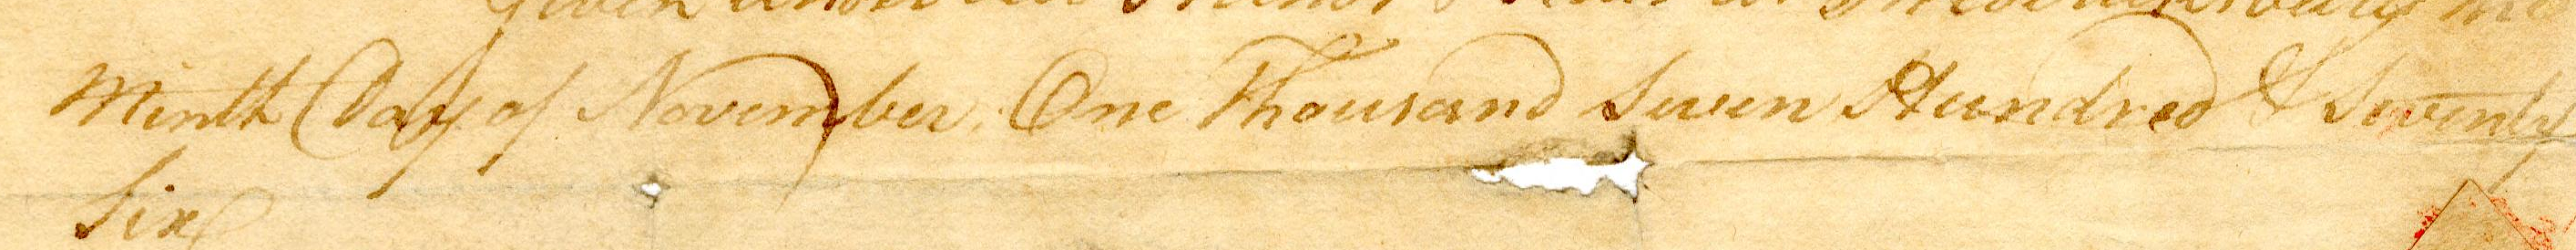ninth day of November, One Thousand Seven Hundred & Seventy
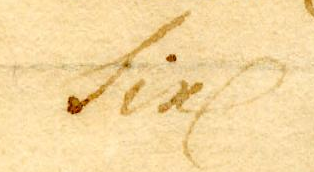Six
